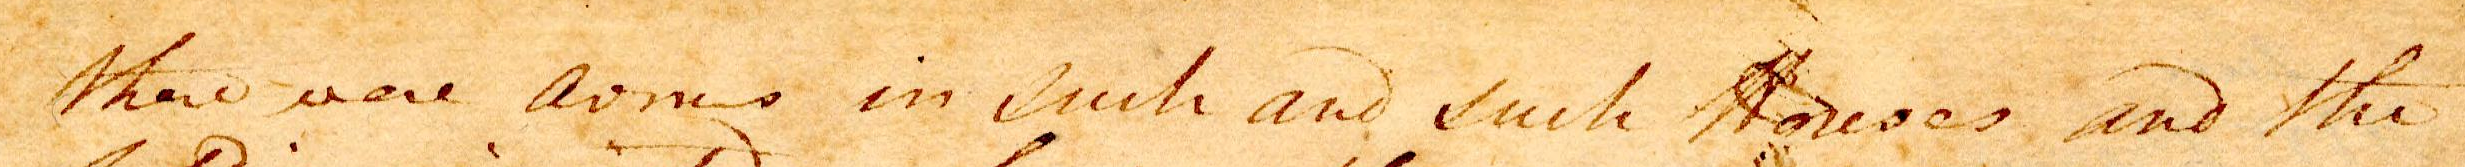there were arms in such and such Houses and the
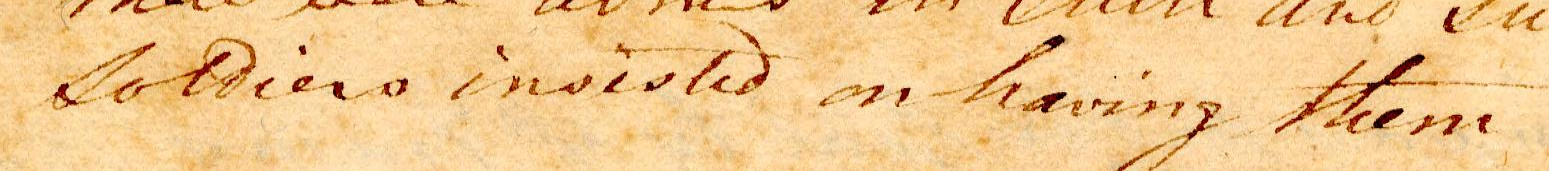Soldiers insisted on having them
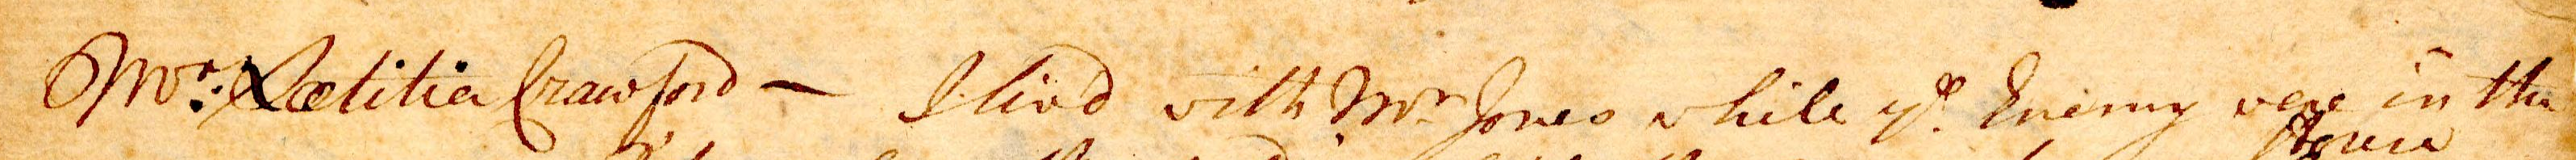M^rs Laetitia Crawford- I liv'd with M^r Jones while y^e Enemy were in the
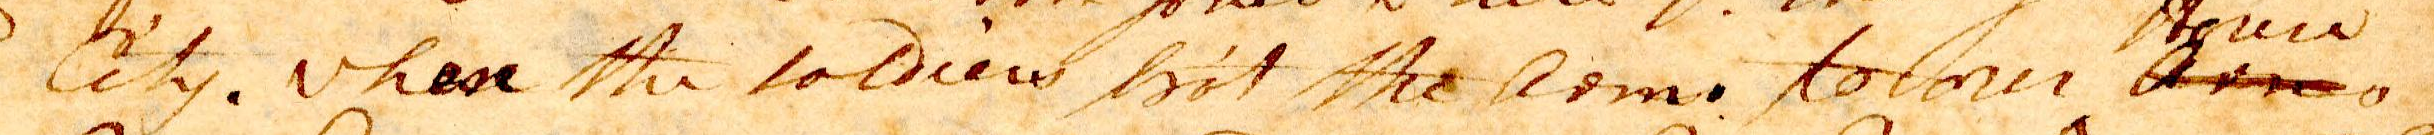City. When the soldiers bro't the arms to our ^ [Arms]
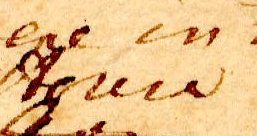House
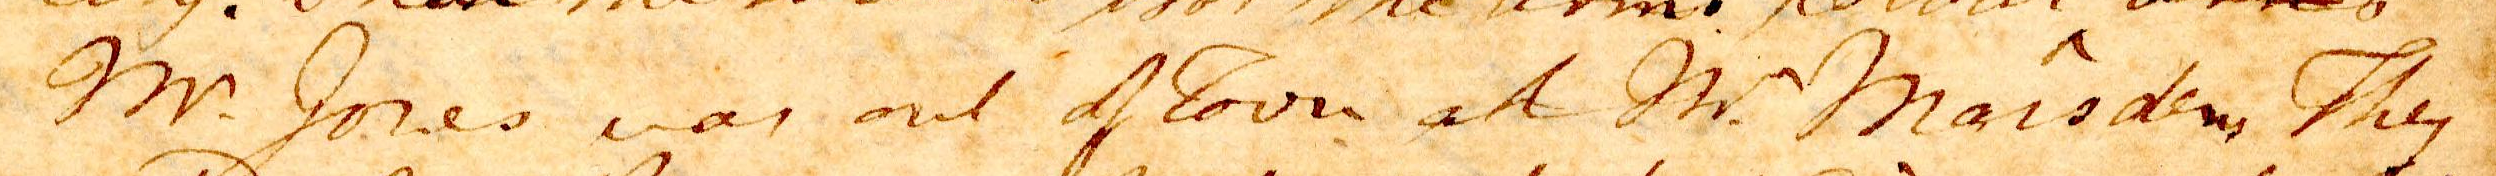M^r. Jones was out of Town at M^r Marsdens. They
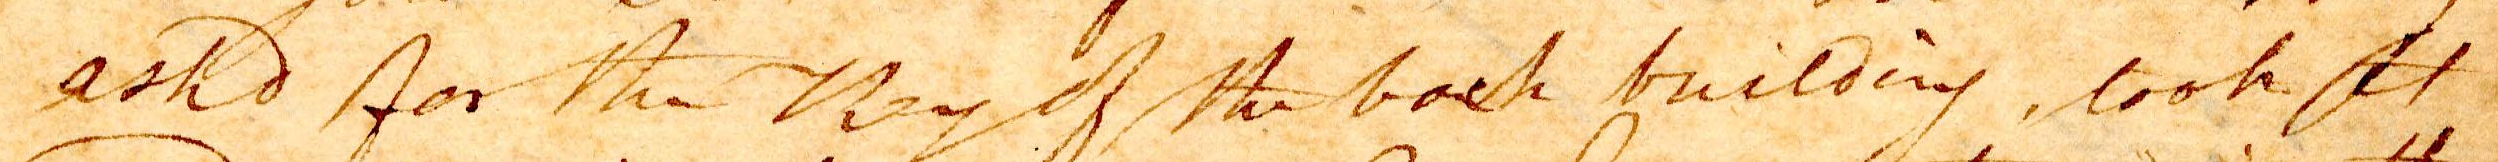ask'd for the key of the back building, took it
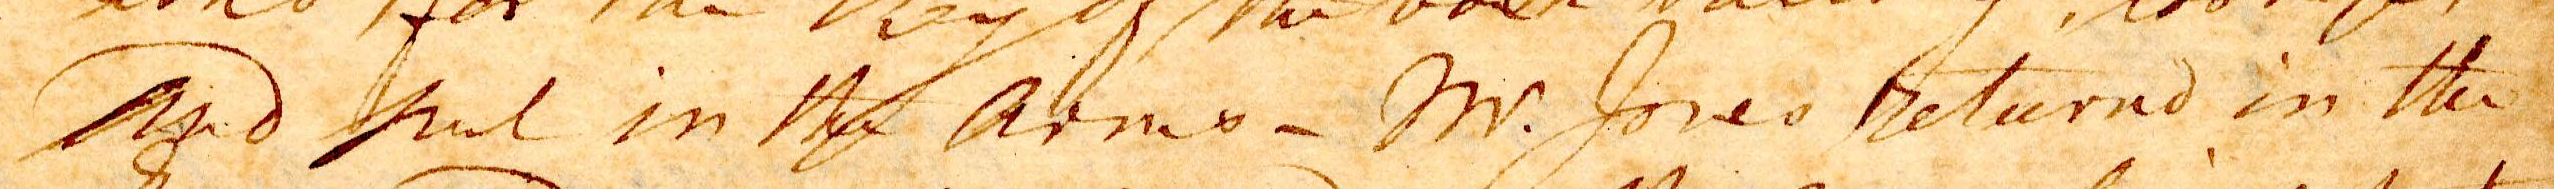and put in the Arms- M^r. Jones returnd in the
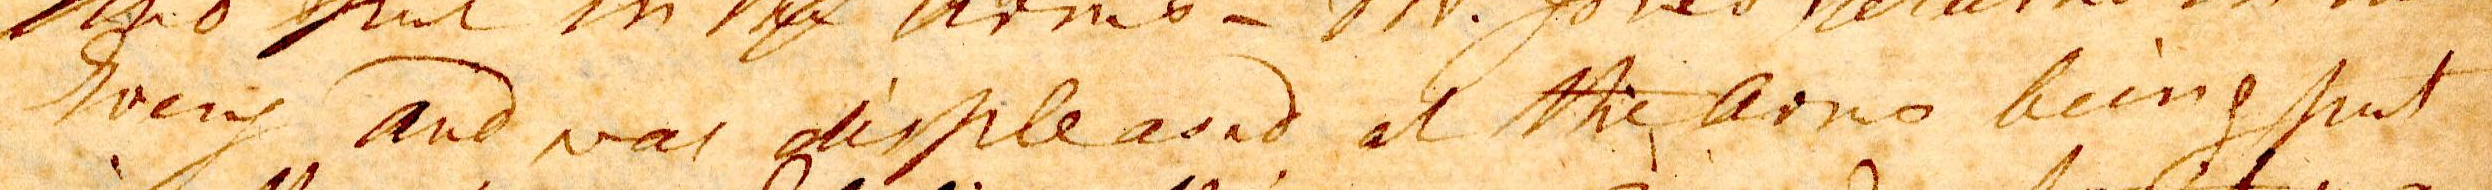Evening and was displeased at the arms being put
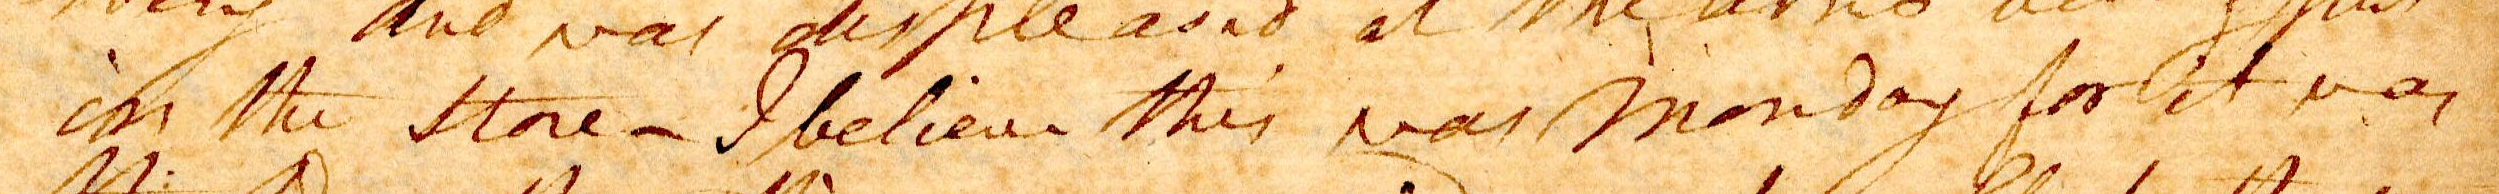in the store- I believe this was Monday for it was
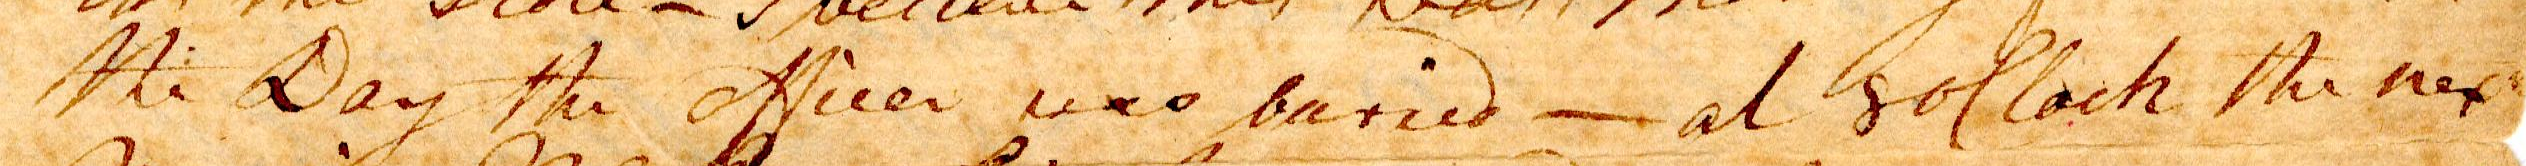the Day the officer was buried – at 8 o'clock the next
